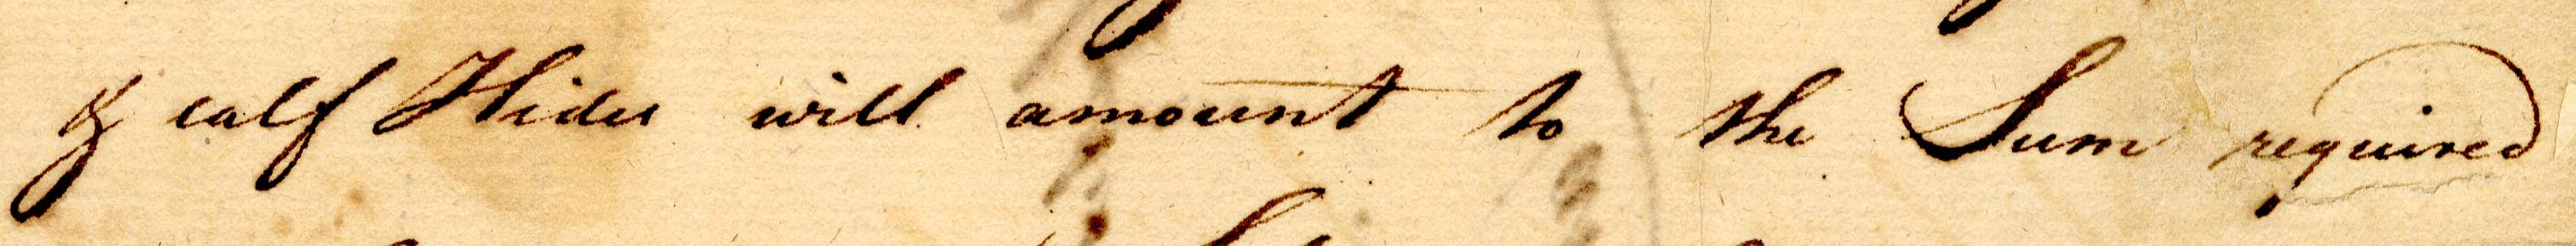of calf Hides will amount to the Sum required
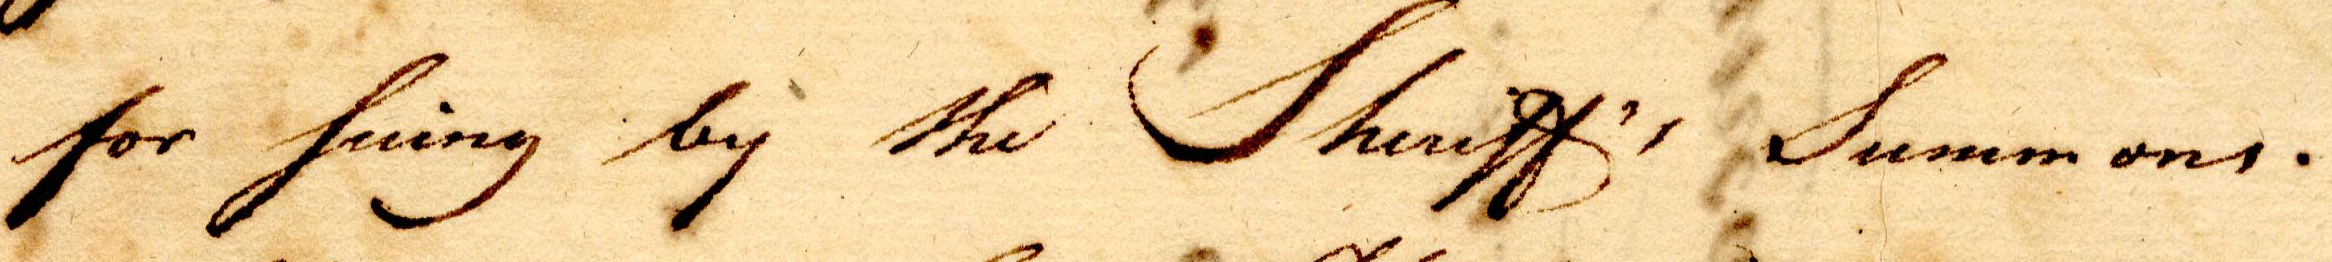for suing by the Sheriff's Summons.
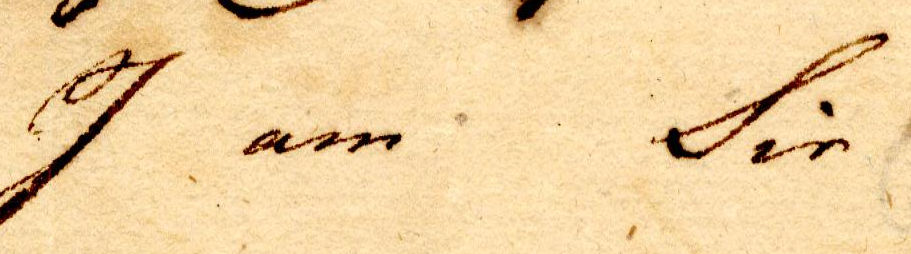I am Sir
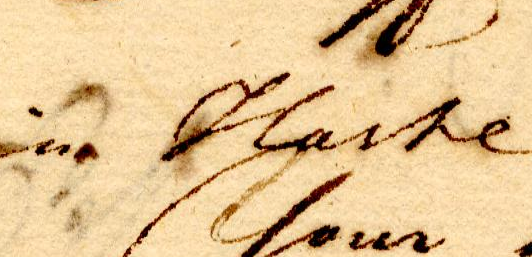in Haste
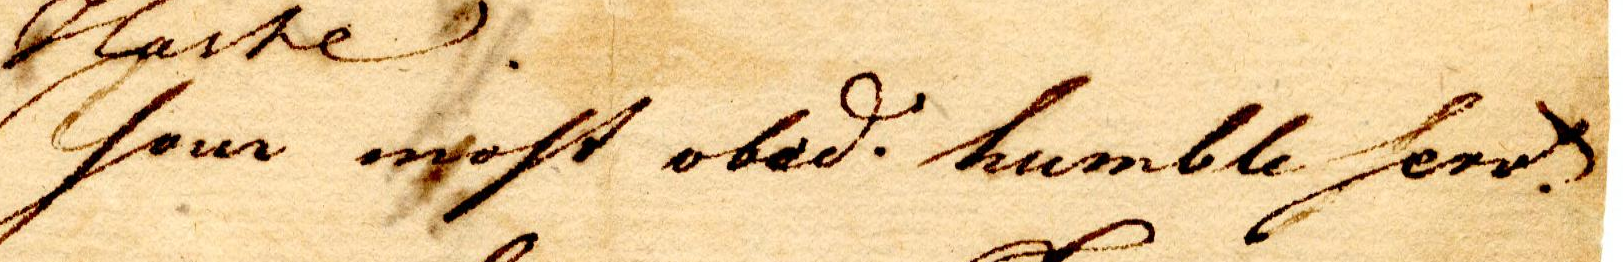Your most obed^t: humble Serv^t.
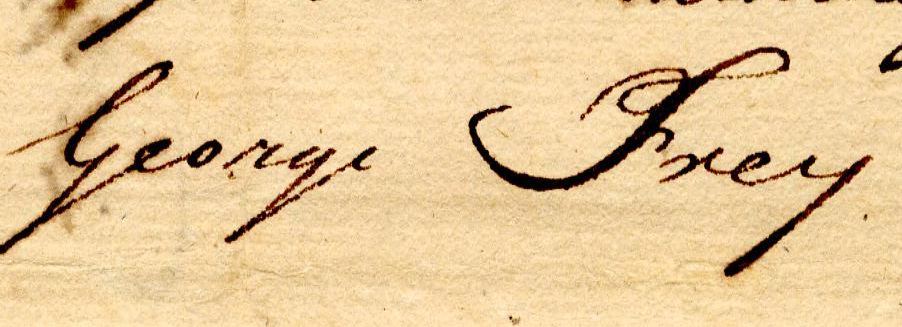George Frey.
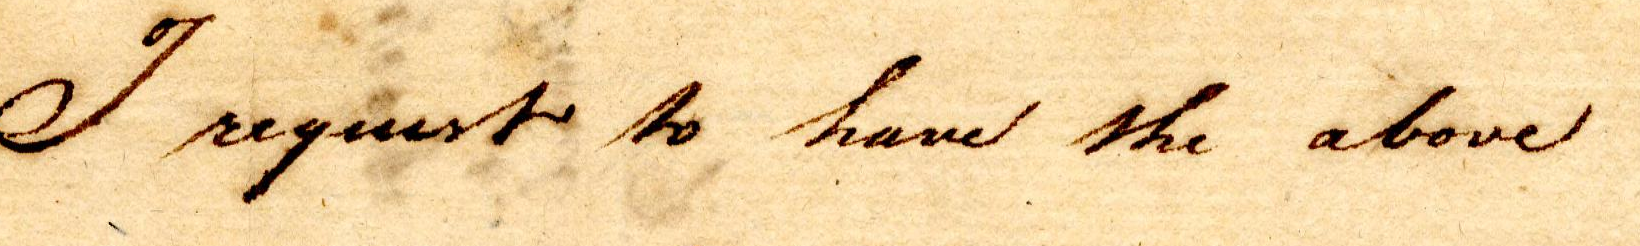I request to have the above
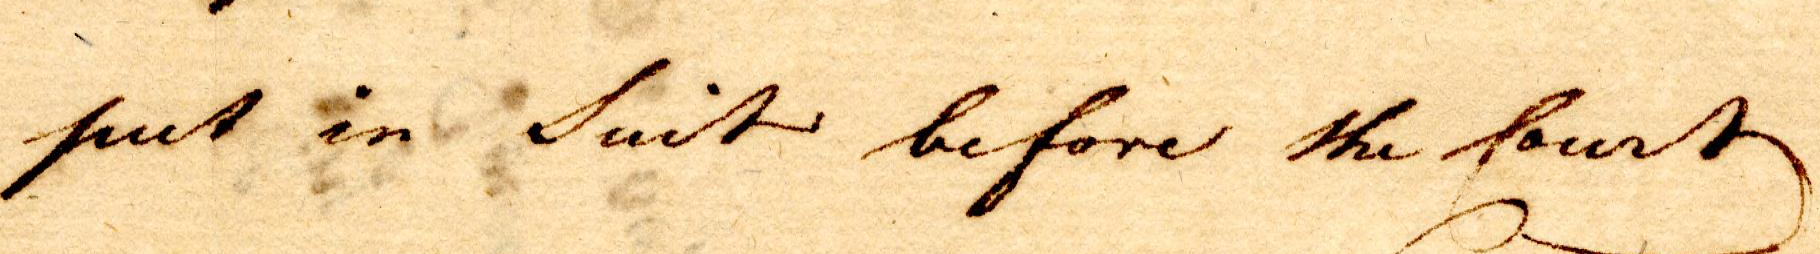put in Suit before the Court
